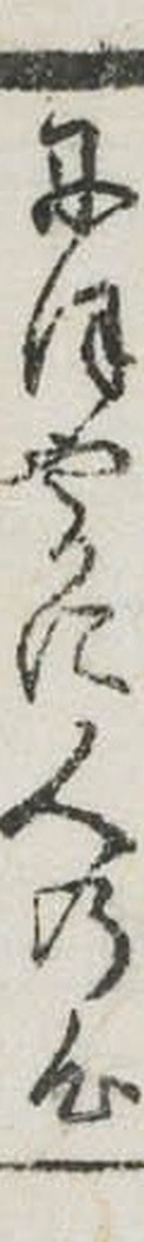にほやかに人の心
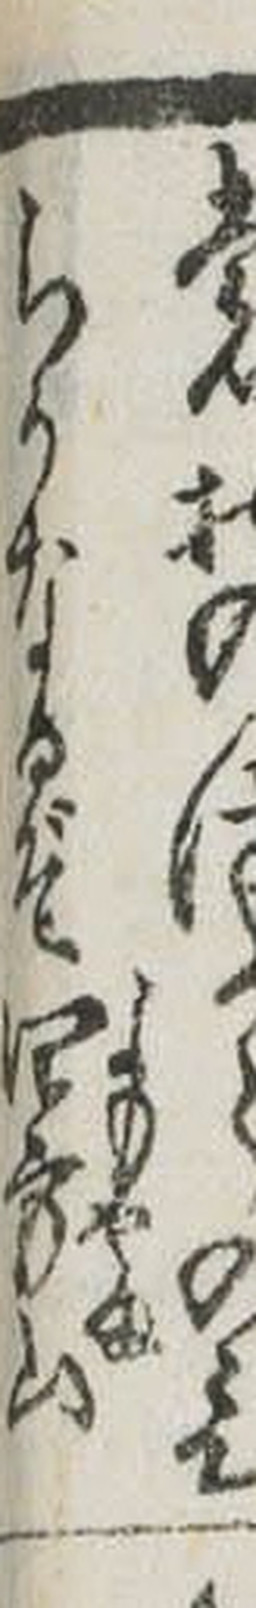らかなるぞ四方山
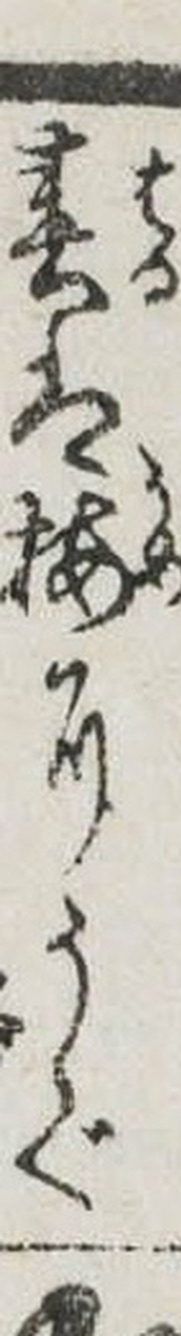春は梅にうぐ
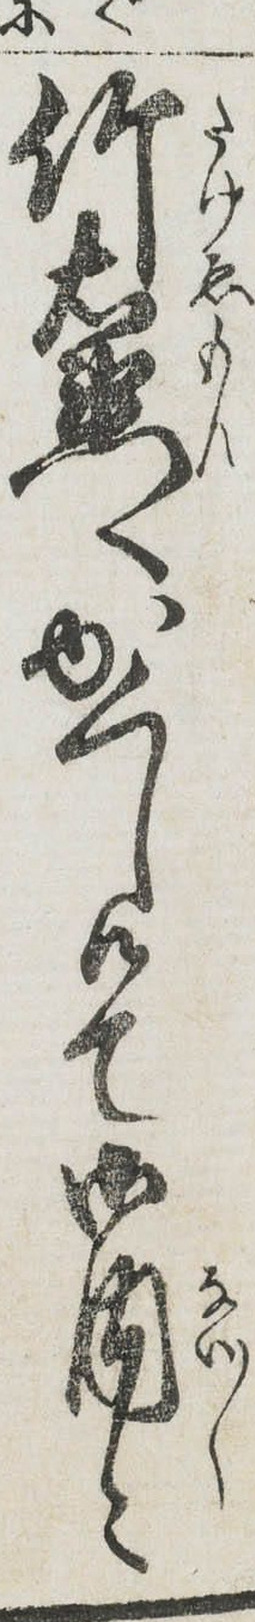竹右衛門へかくし候て御内々
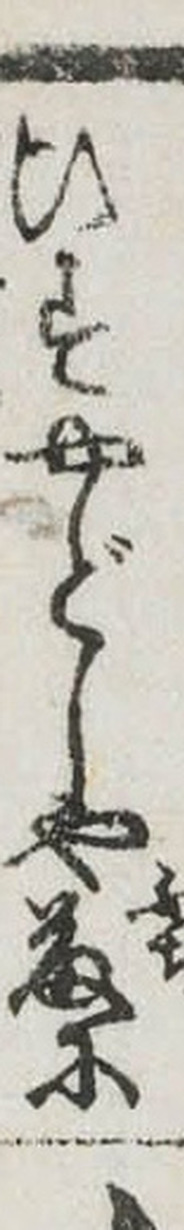ひすやどしや藤に
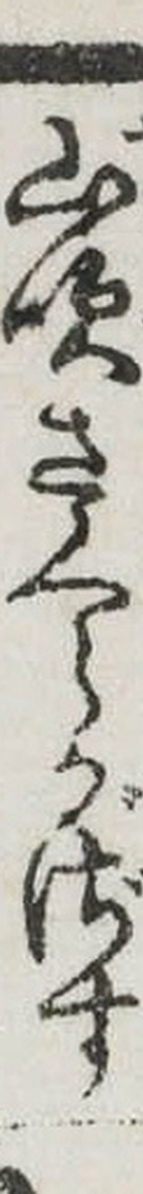山吹さくらがざす
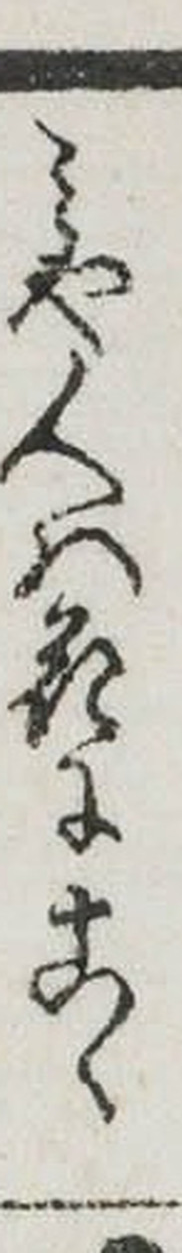みや人は花にこゝ
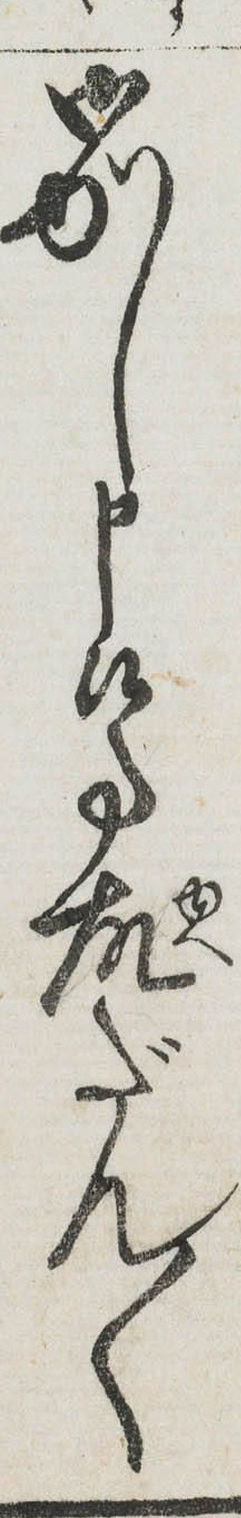御かし申候事故だん〳〵
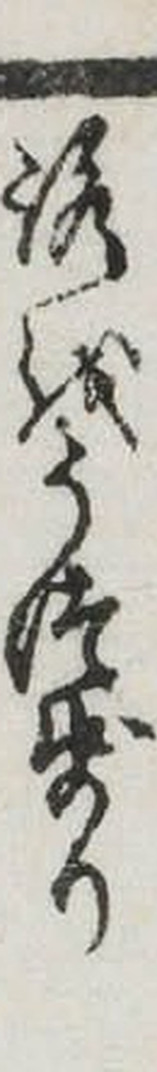ろをうつせり
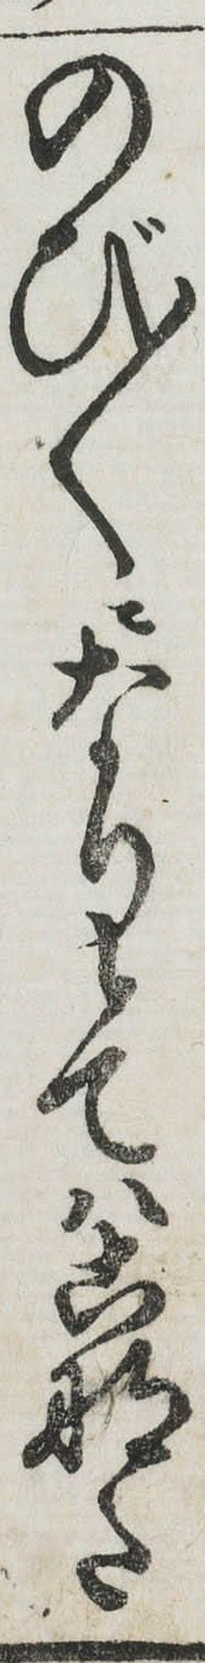のび〳〵になり候てはこなた
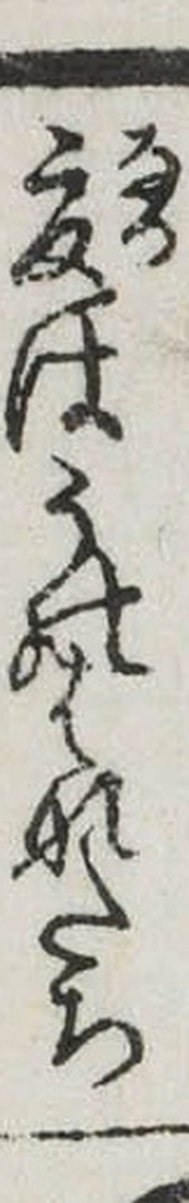夏はうのはなたち
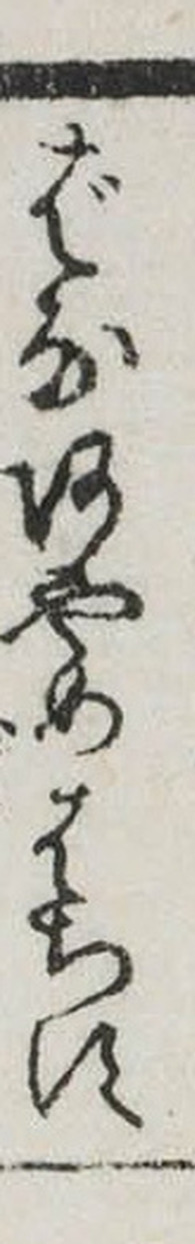ばなあやめはちす
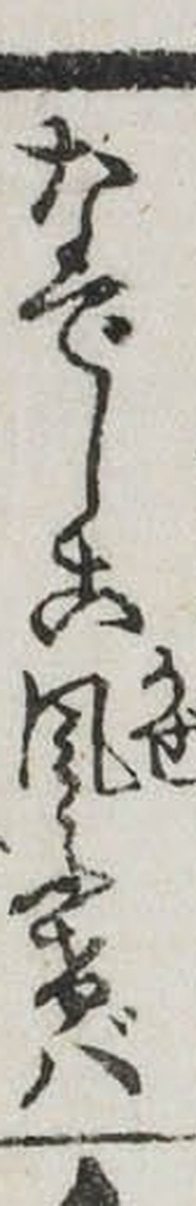なでしこ風ふけば
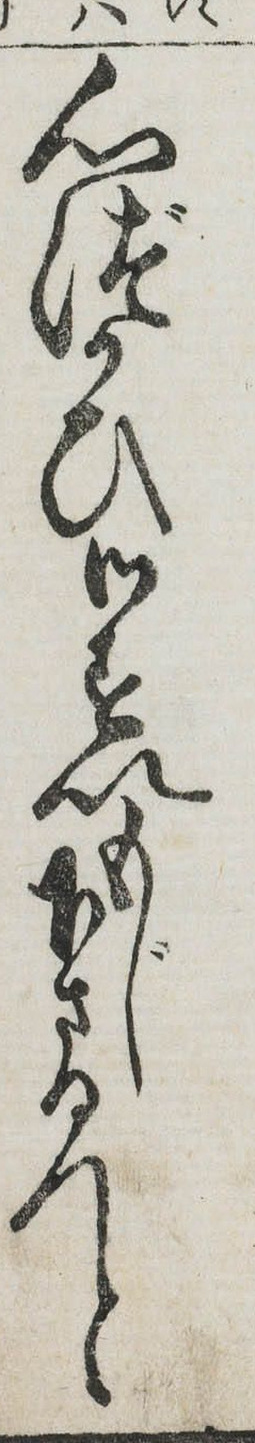心づかひ御すいもじ下さるへく候
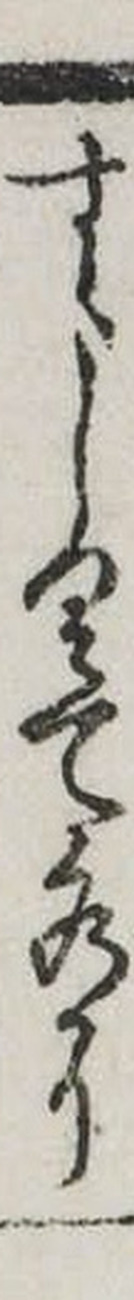すゝしくて水に
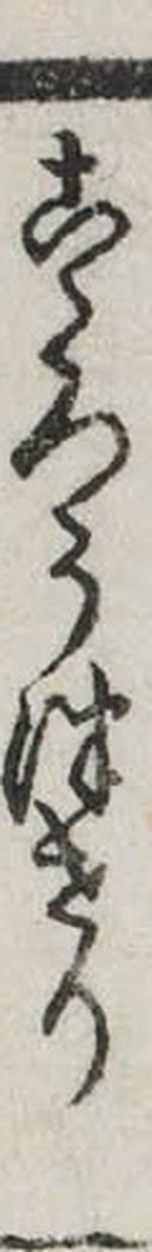こゝろうつせり
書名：頭書萬用婦人手紙之文言
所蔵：東京学芸大学教育コンテンツアーカイブ
